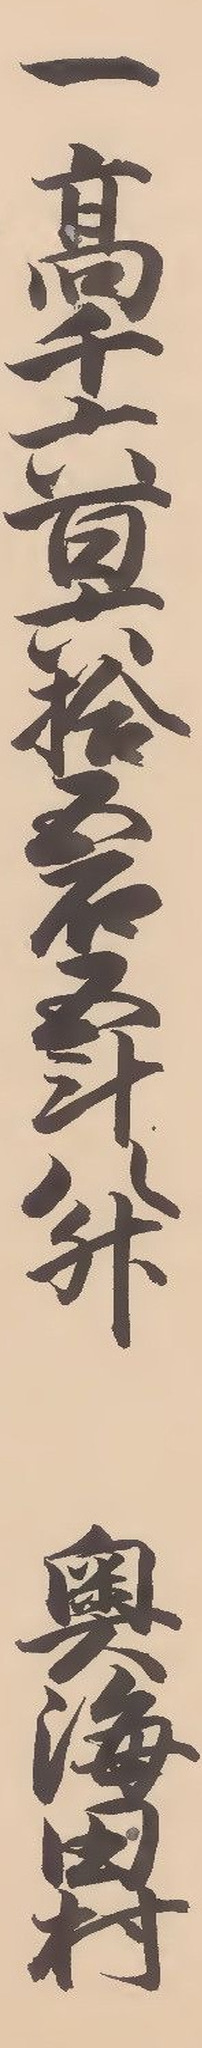一高千六百六拾五石五斗八升奥海田村
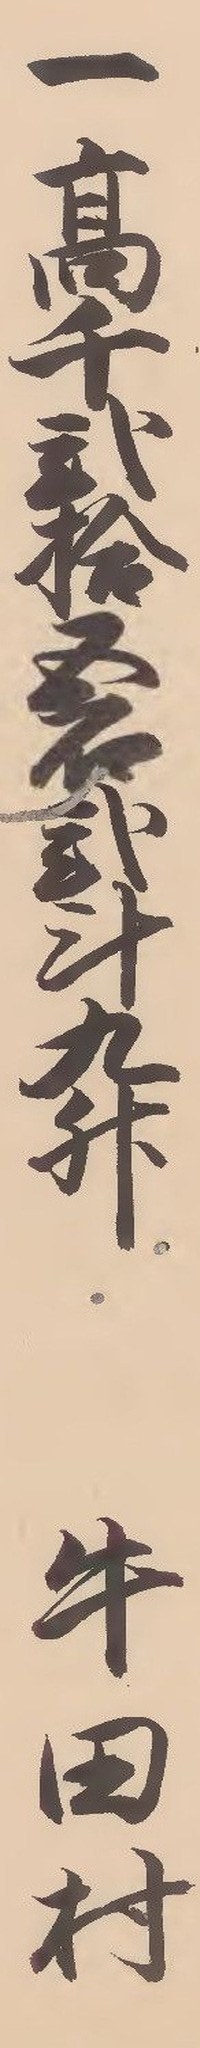一高千弐拾五石弐斗九升牛田村

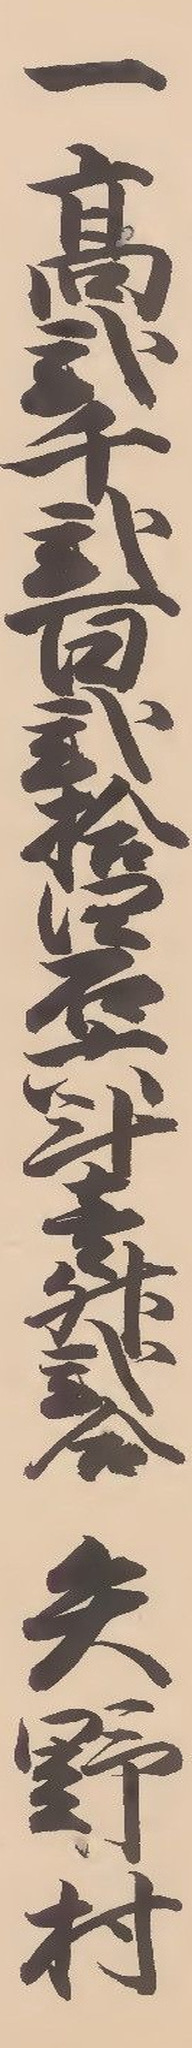一高弐千弐百弐拾四石六斗壱升弐合矢野村
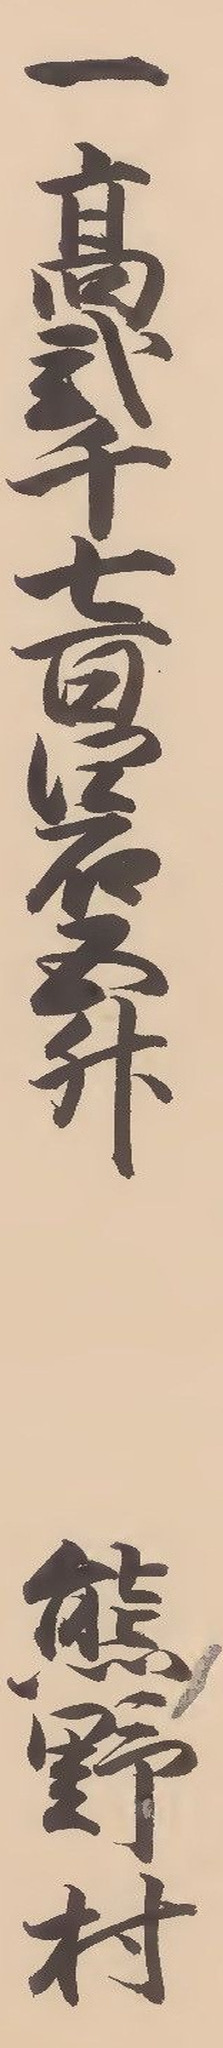一高弐千七百四石五升熊野村
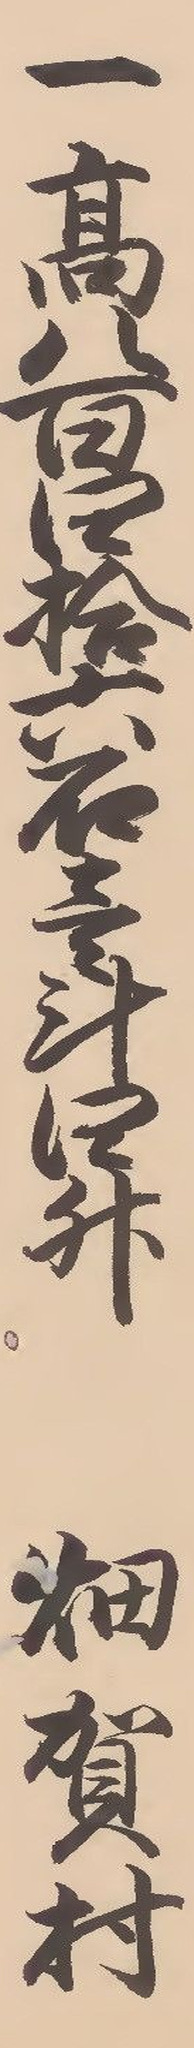一高八百四拾六石壱斗四升畑賀村
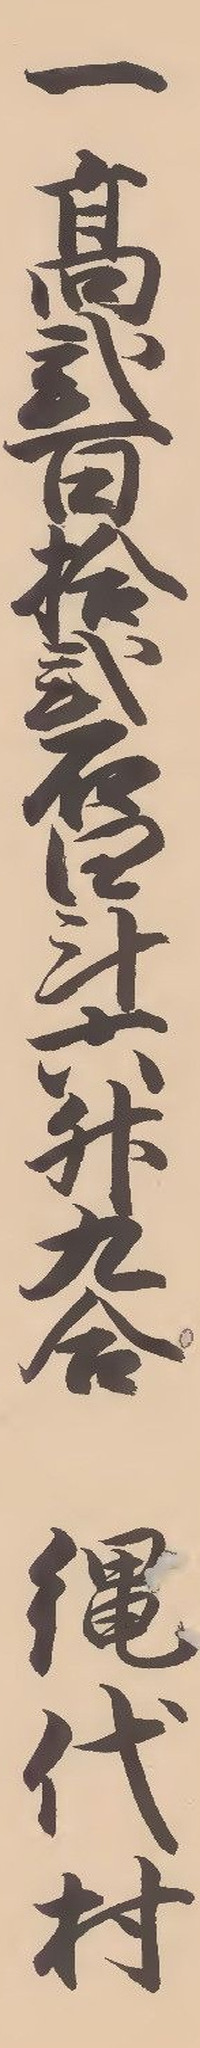一高弐百拾弐石四斗六升九合縄代村
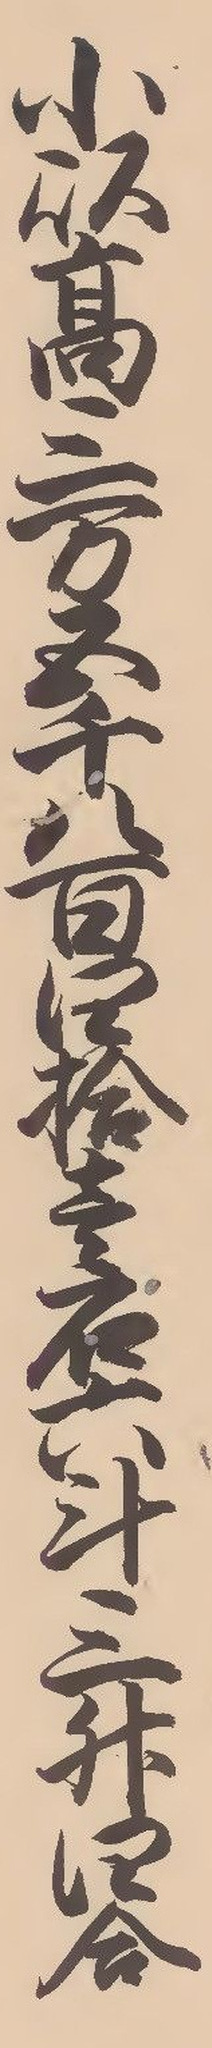小以高三万五千八百四拾壱石六斗三升四合

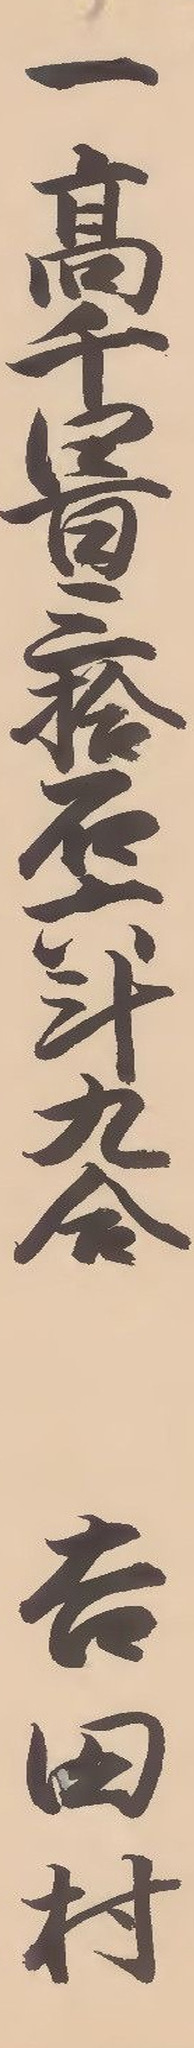一高千四百三拾石六斗九合吉田村
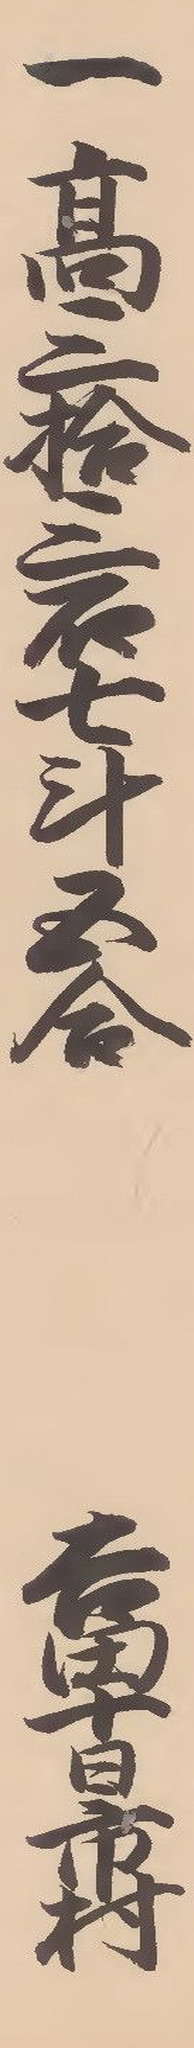一高三拾三石七斗五合吉田十日市村
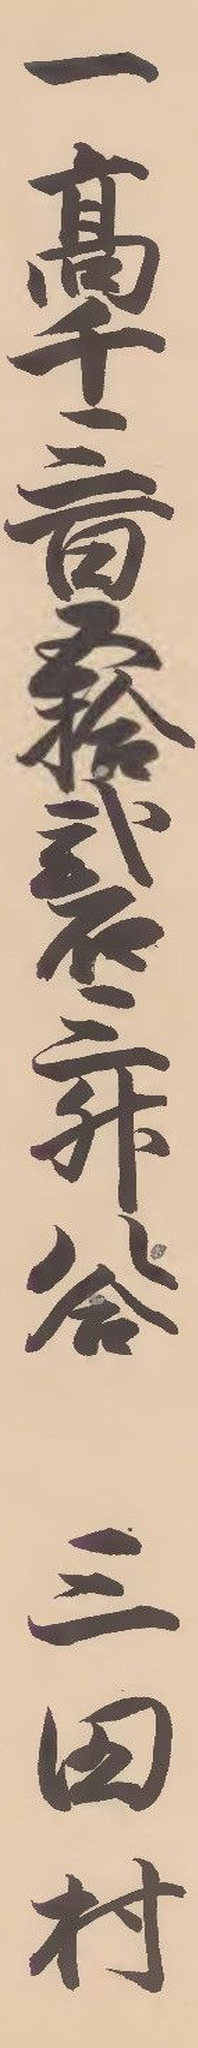一高千三百五拾弐石三升八合三田村

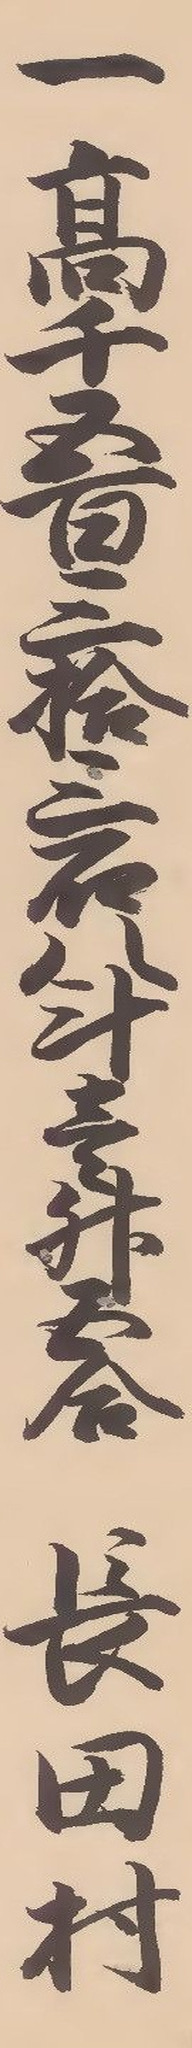一高千五百三拾三石八斗壱升五合長田村
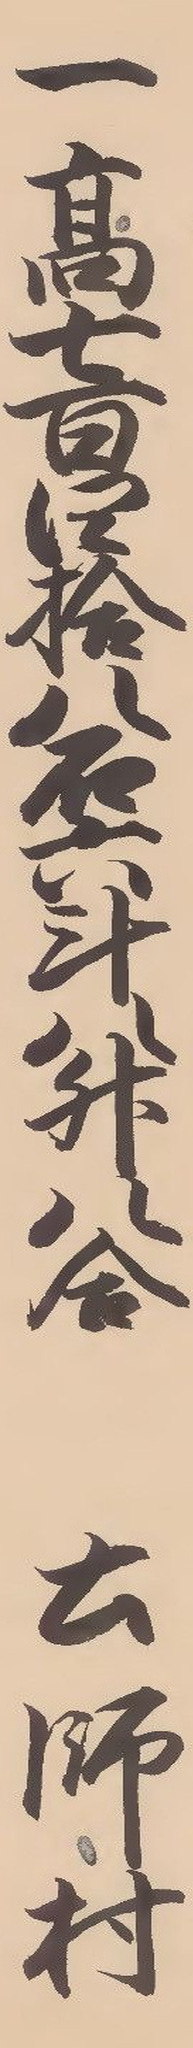一高七百四拾八石六斗八升八合土師村
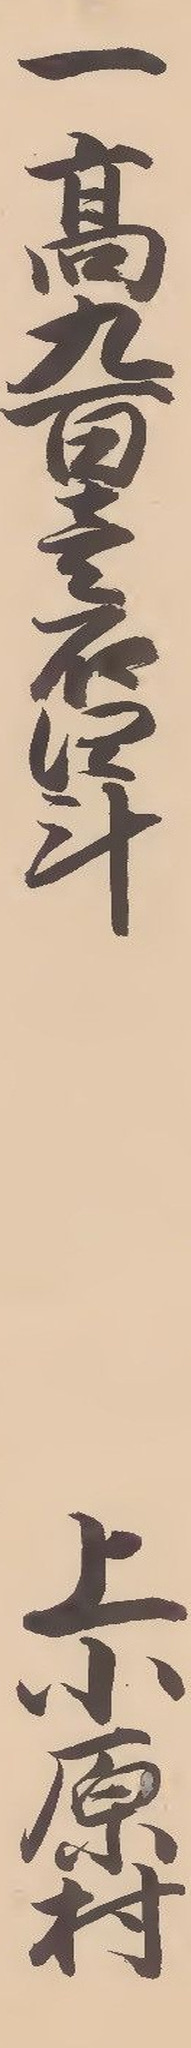一高九百壱石四斗上小原村
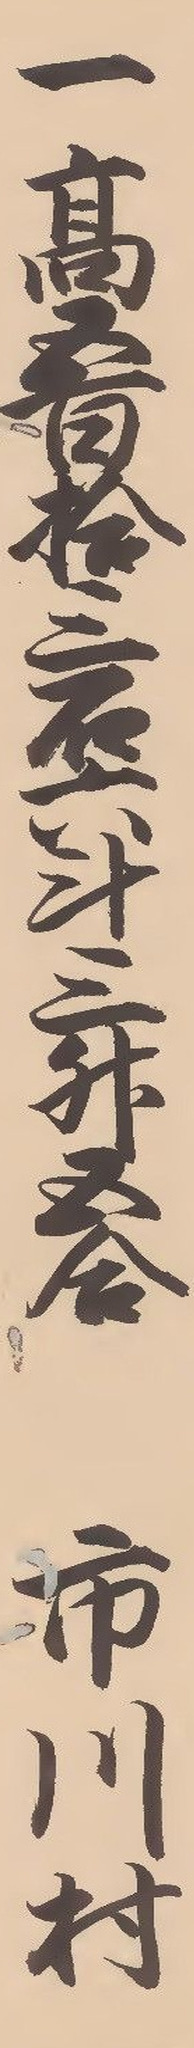一高五百拾三石六斗三升五合市川村
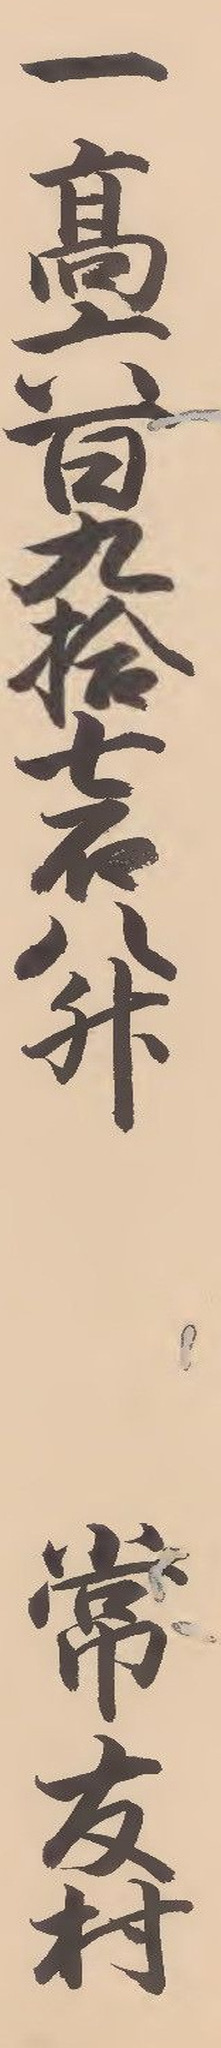一高六百九拾七石八升常友村
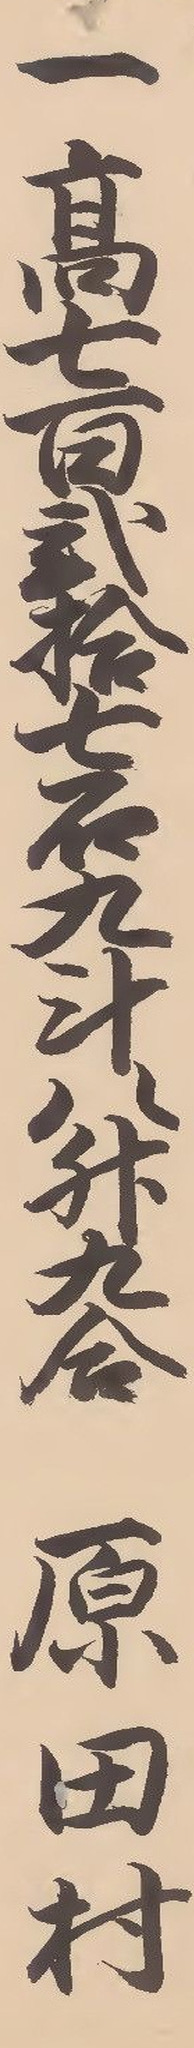一高七百弐拾七石九斗八升九合原田村
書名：安芸国郷帳
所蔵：国立公文書館 National Archives of Japan
